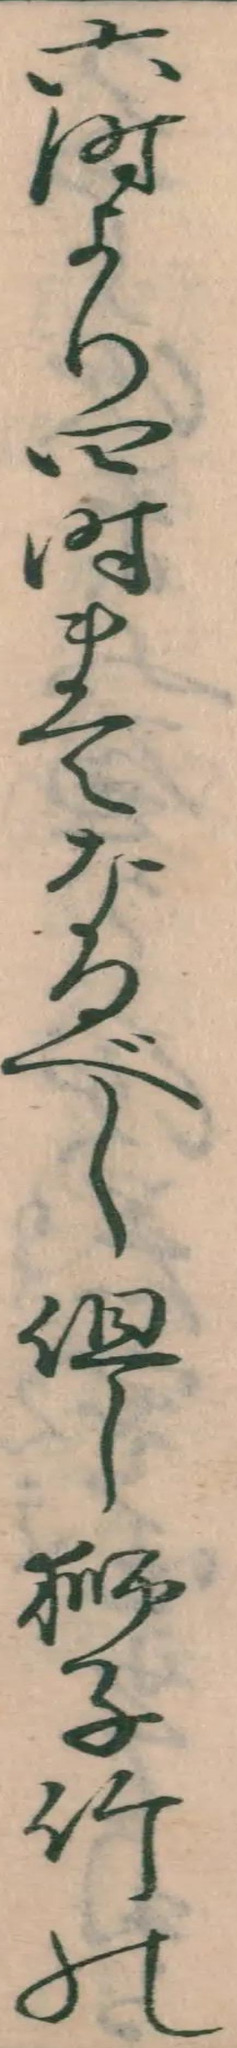六時より四時まてなるべし但し獅子竹の
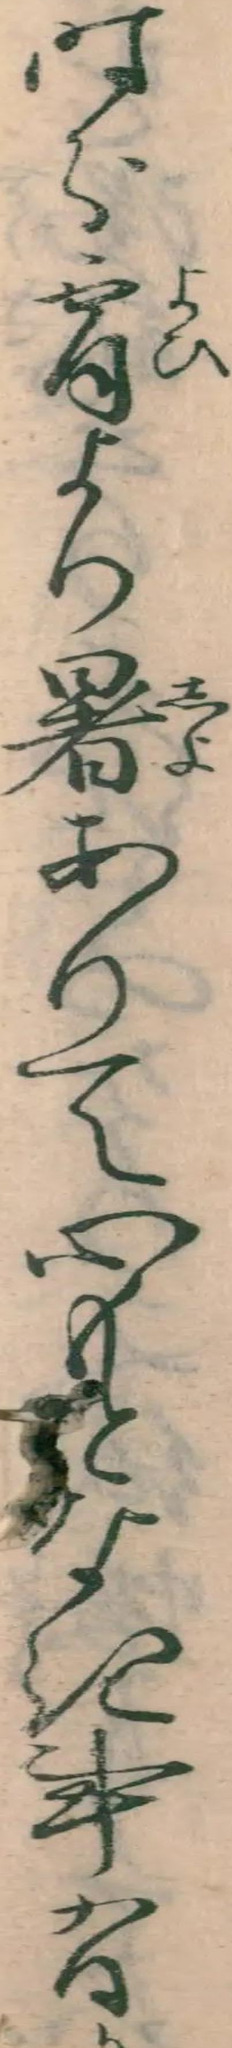時分宵より暑ありて心もとなき事有り
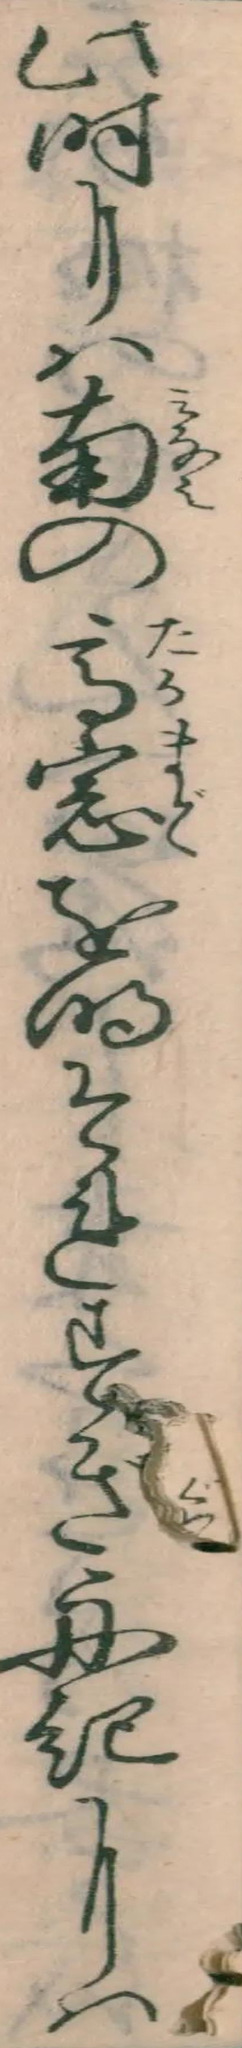此時には南の高窓を明それすぎ舟起には
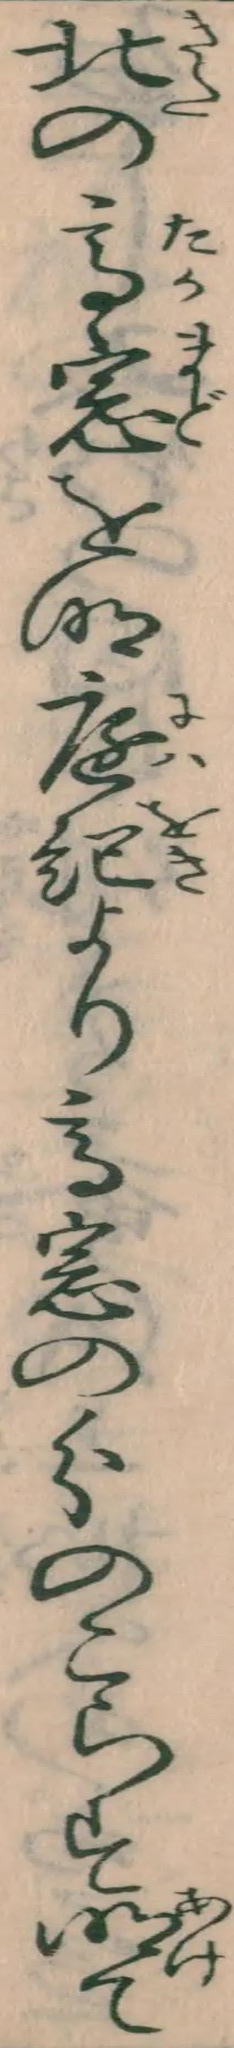北の高窓を明庭起より高窓の分のこらす明て
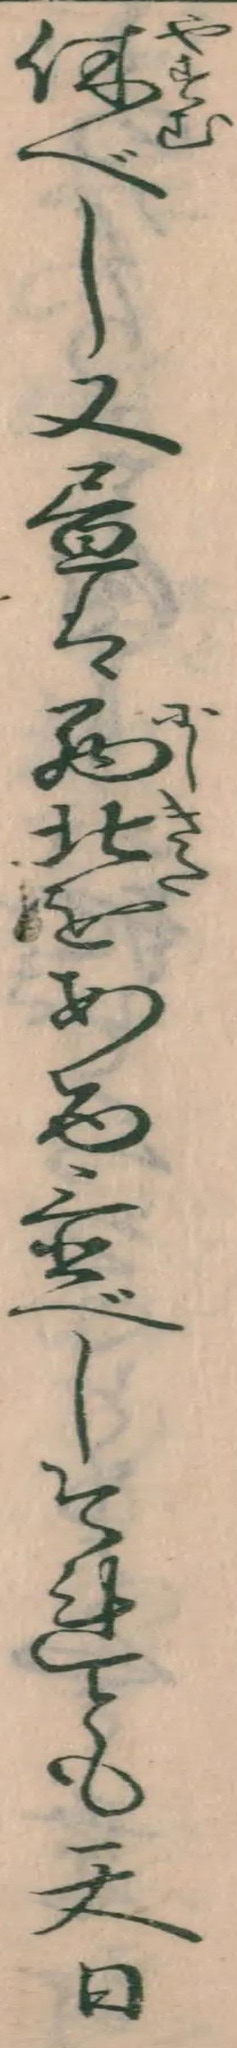休べし又昼は西北をあけ置べしそれとも天日
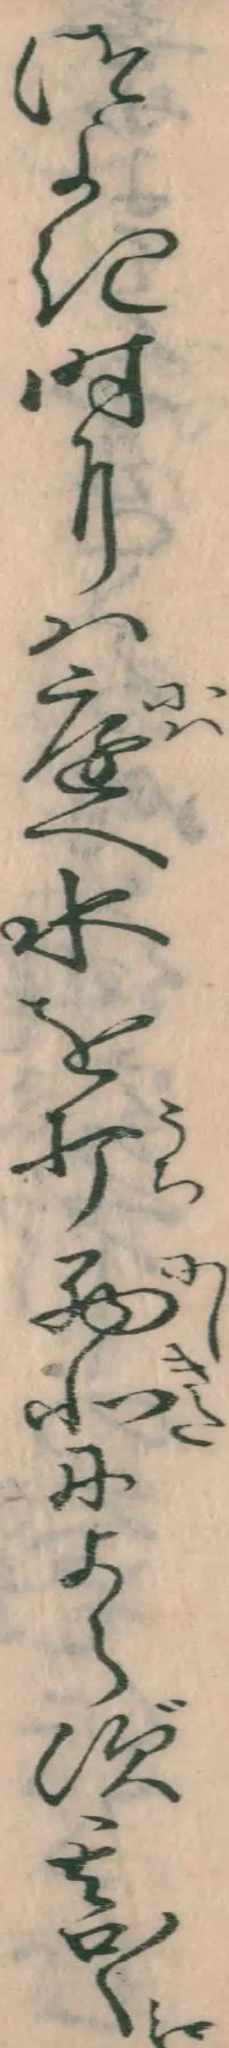つよき時には庭へ水を打西北によらず其口〳〵え
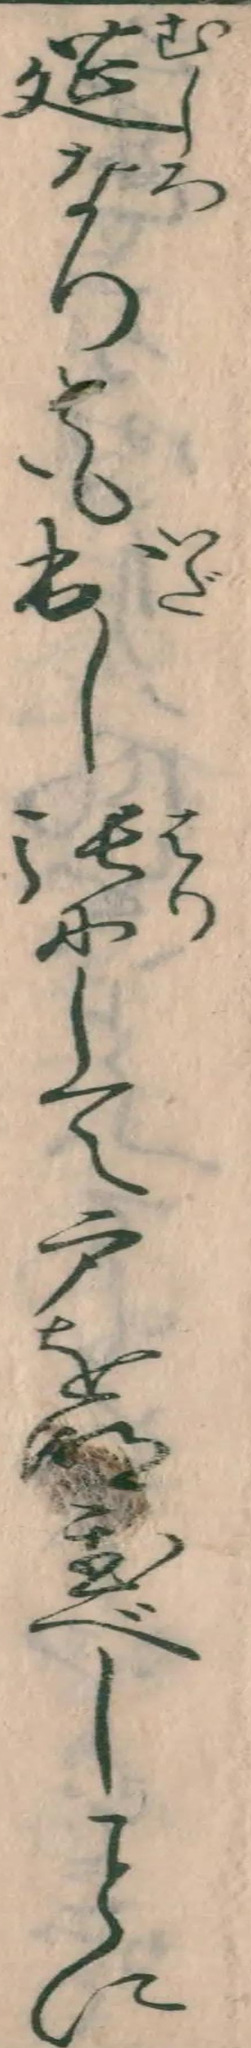莚なりとも出し張にして戸を明置べしことに
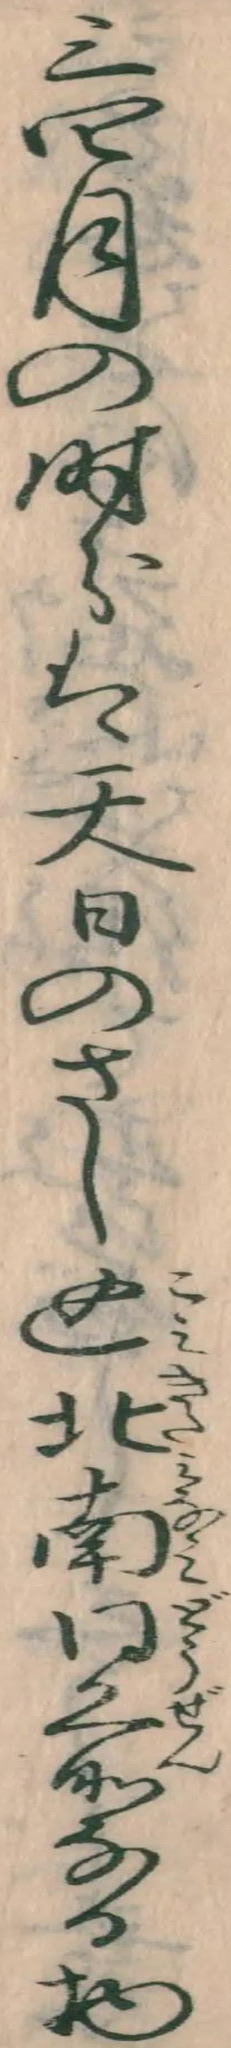三四月の時分は天日のさし込北南同前なる物
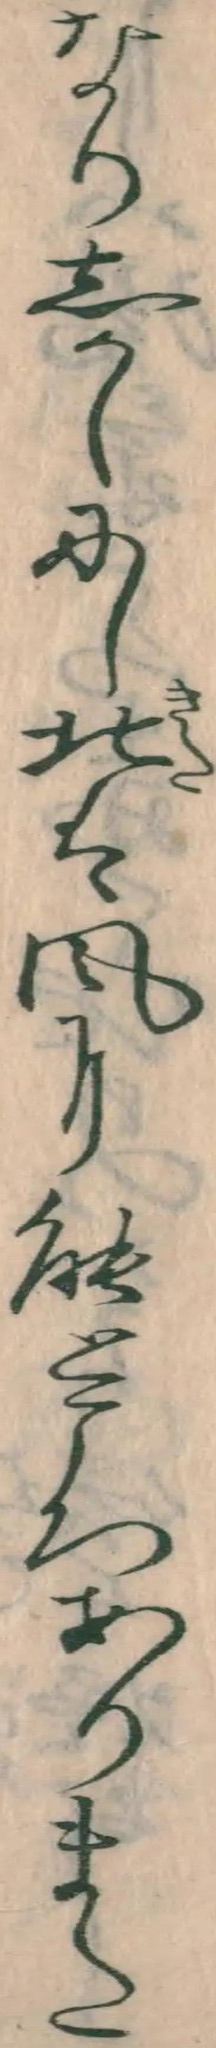なりしかしにし北は風に能ところありまた
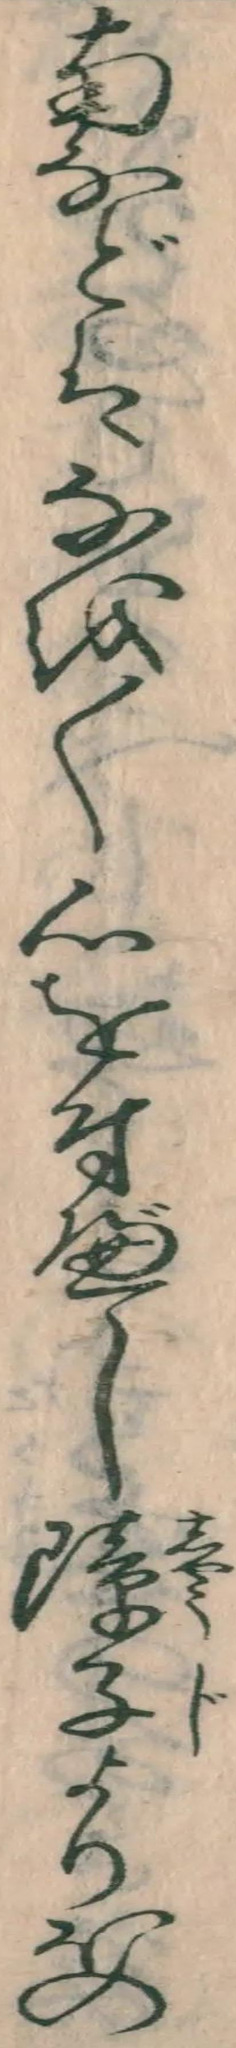南などはなを〳〵心を付べし障子よりほの
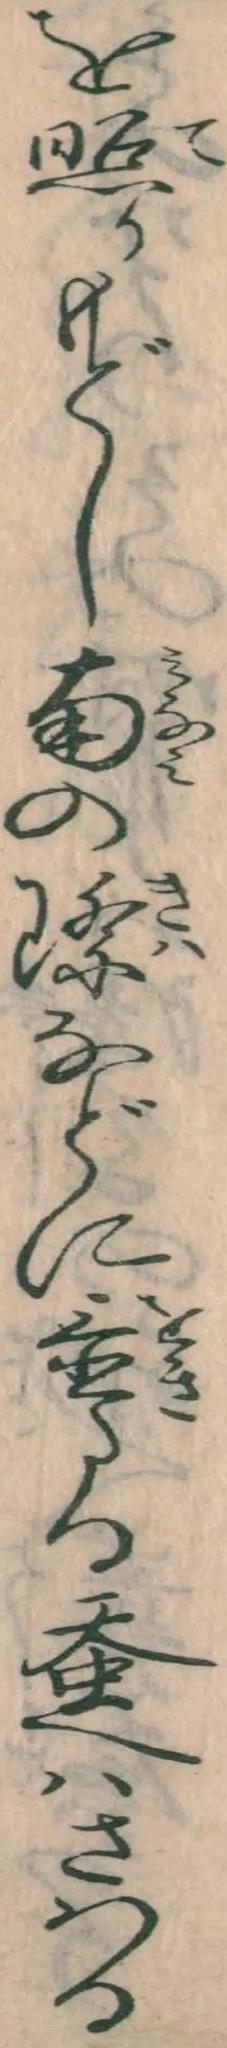を照りもどし南の際などに置たる蚕はさはる

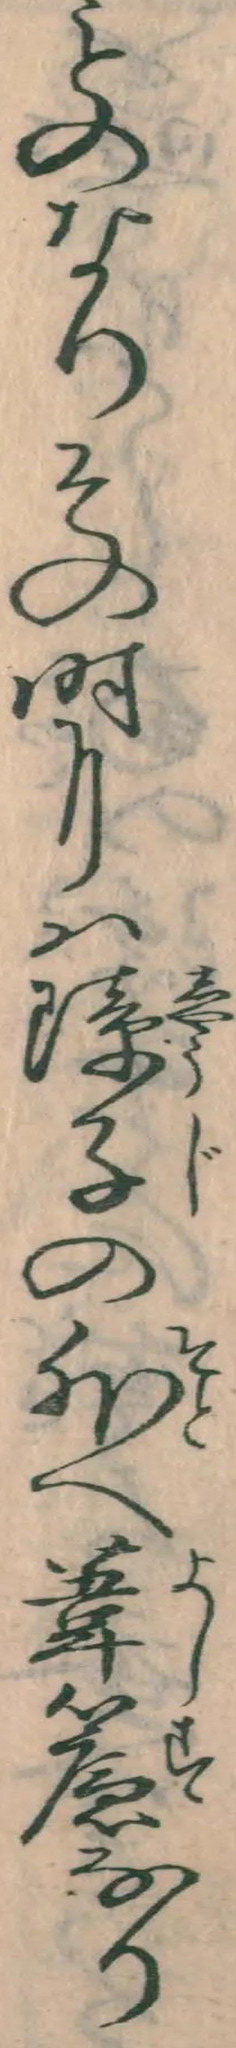ものなりその時には障子の外へ葦簾なり
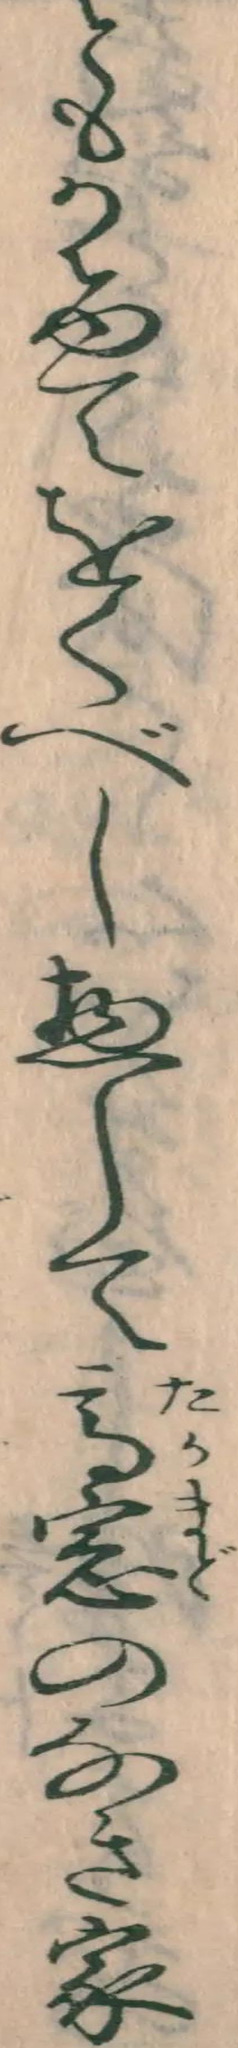ともかけてをくべし惣して高窓のなき家
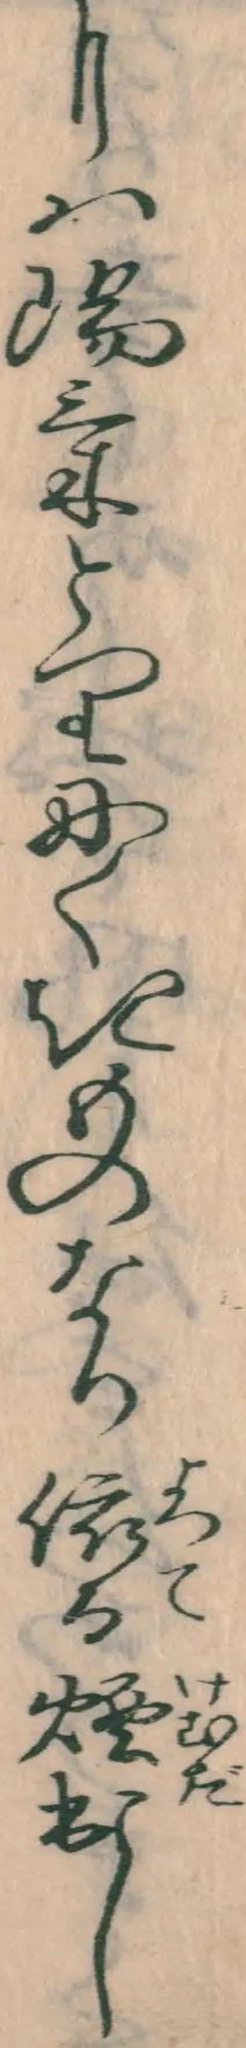には陽気とりにくきものなり依而煙出し
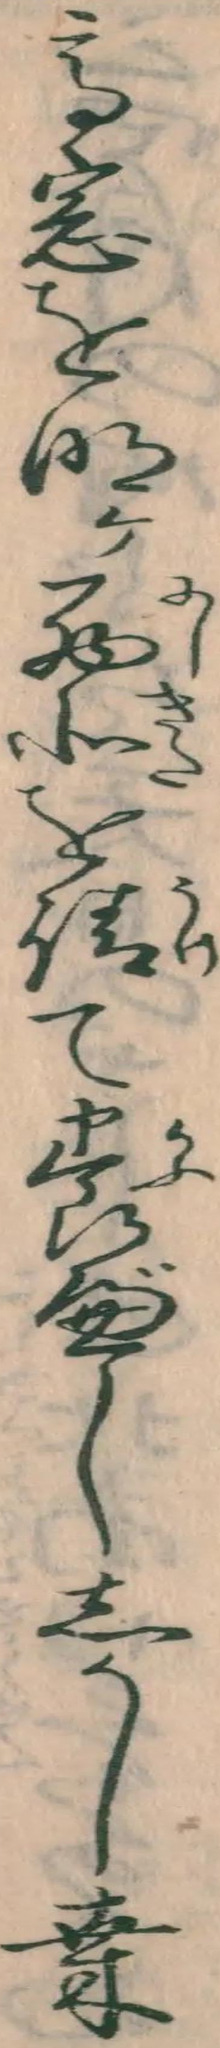高窓を明け西北を請て養べししかし桑
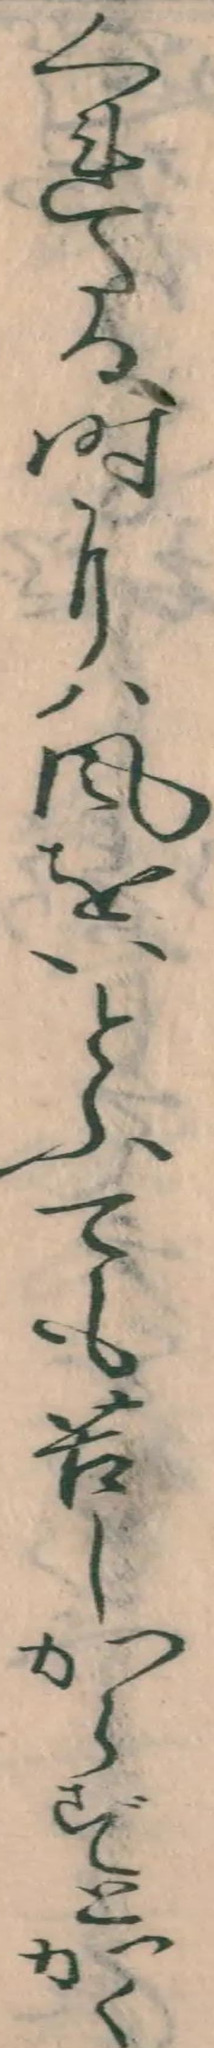くれたる時には風をいとふても苦しからずとかく
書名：新撰養蚕秘書
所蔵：国立国会図書館 National Diet Library, JAPAN
